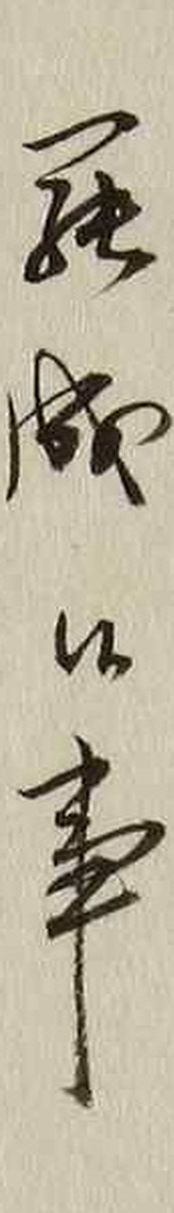罷成候事
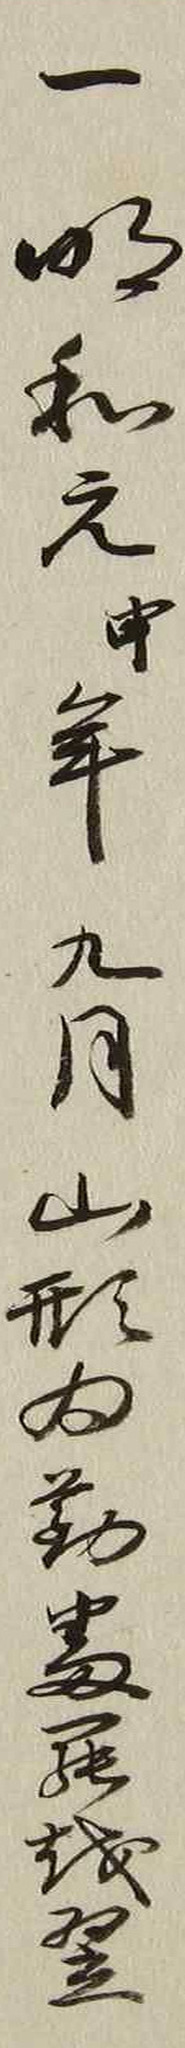一明和元申年九月山形為勤番罷越翌
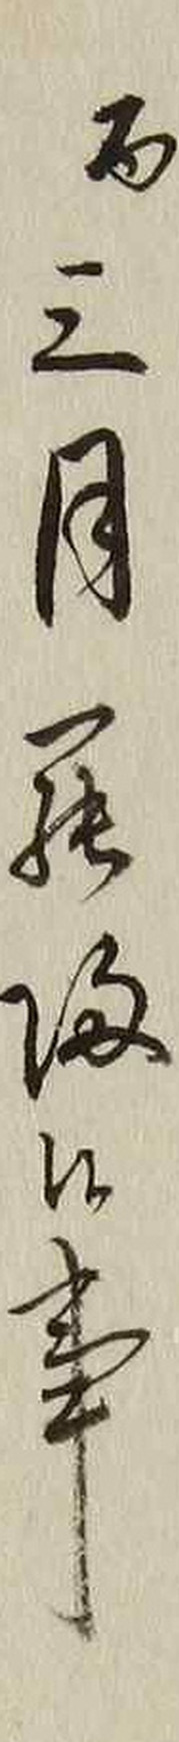酉三月罷帰候事
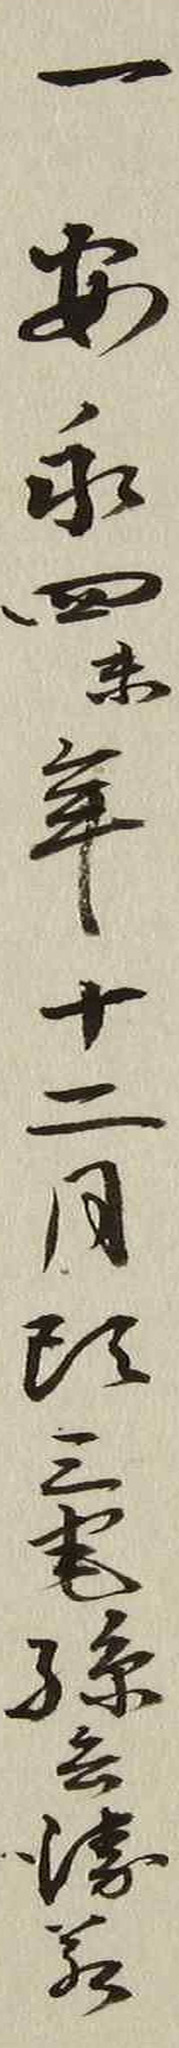一安永四未年十二月頭三宅孫兵衛若
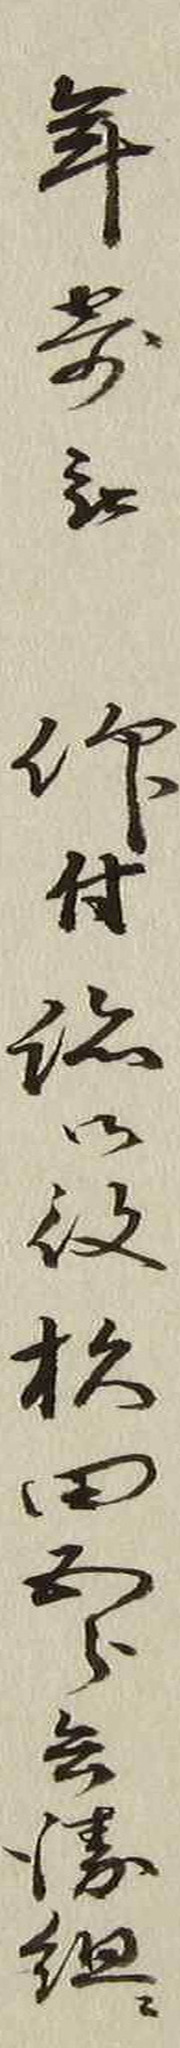年寄被仰付跡御役杉田五郎兵衛組ニ
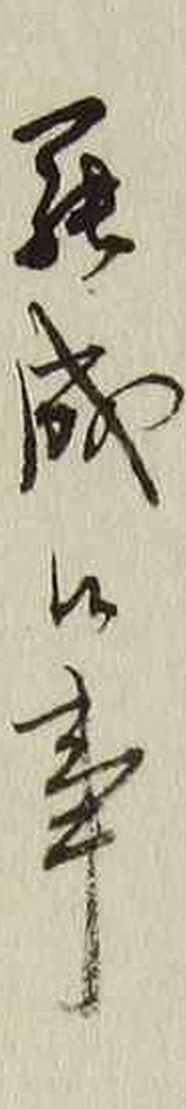罷成候事
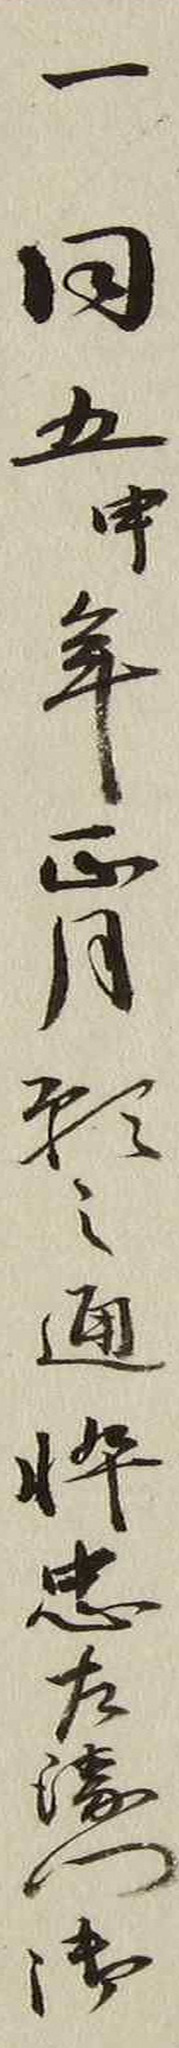一同五申年正月願之通忰忠左衛門御
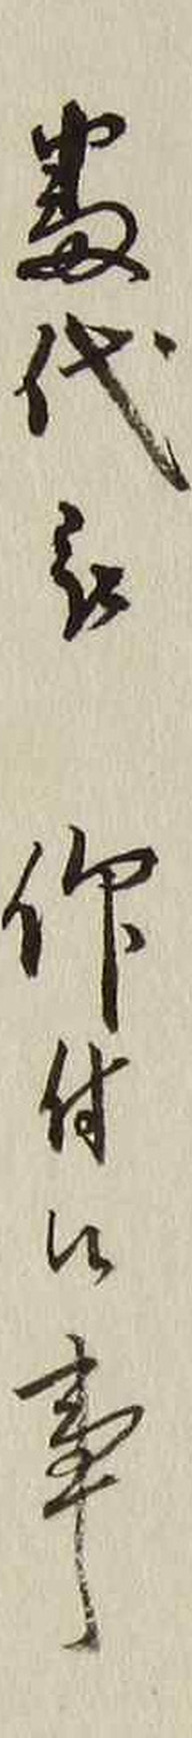番代被仰付候事
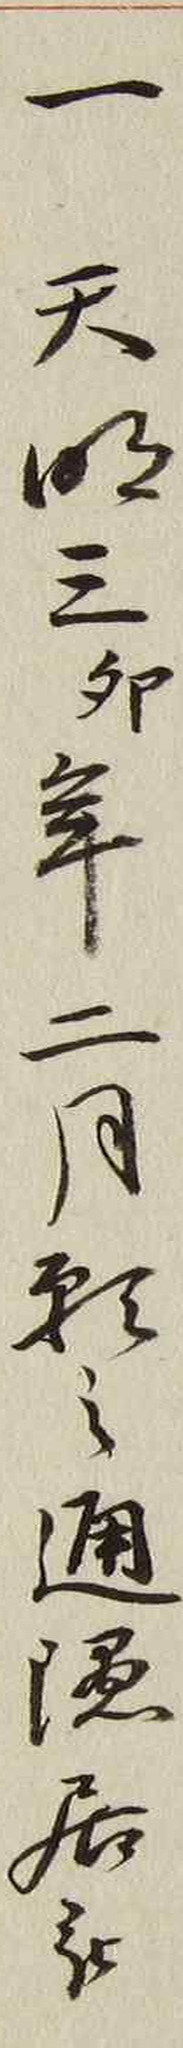一天明三卯年二月願之通隠居被
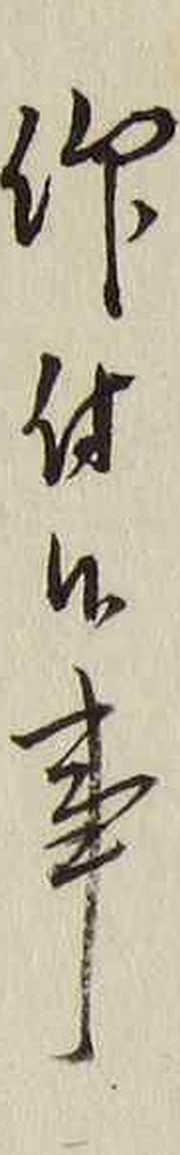仰付候事
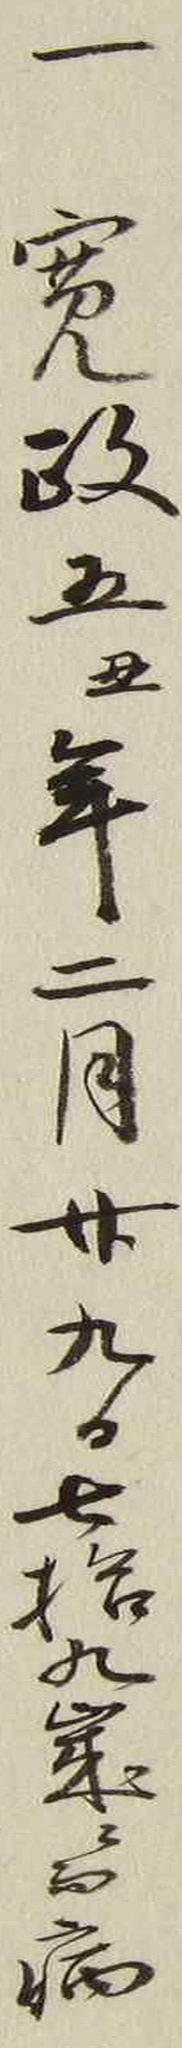一寛政五丑年二月廿九日七拾九歳ニ而病
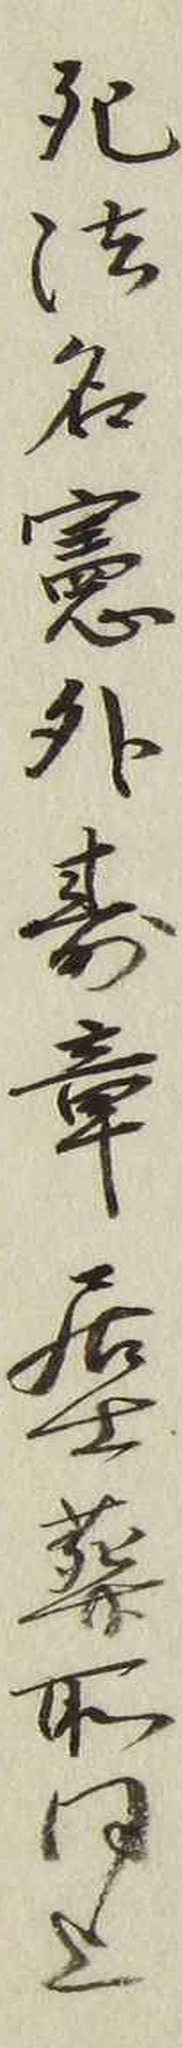死法名憲外寿章居士葬所同上

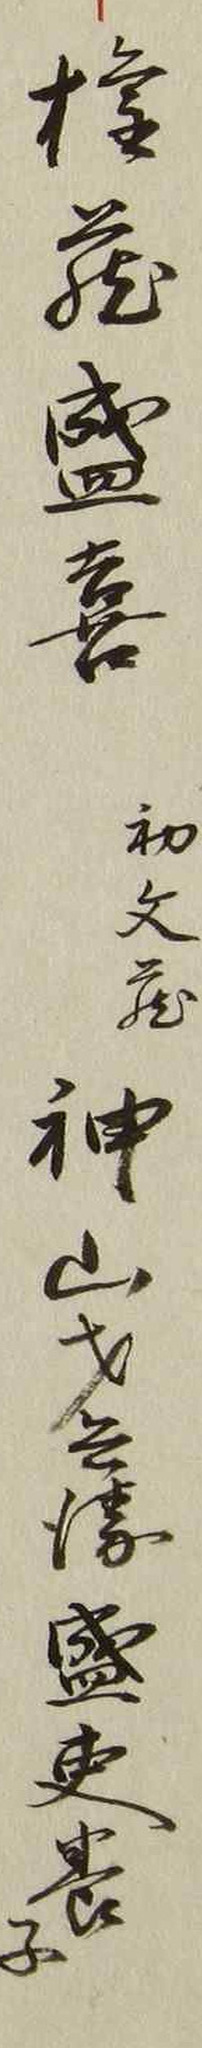権蔵盛喜初文蔵神山才兵衛盛吏養子
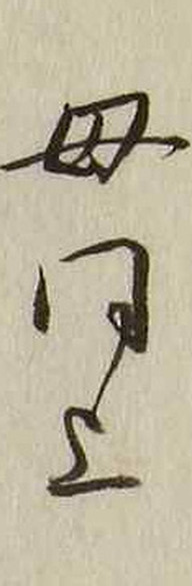母同上
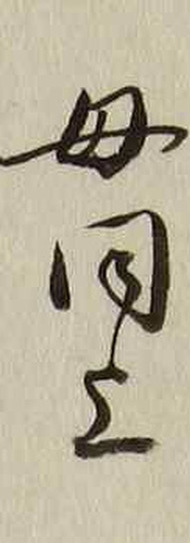母同上
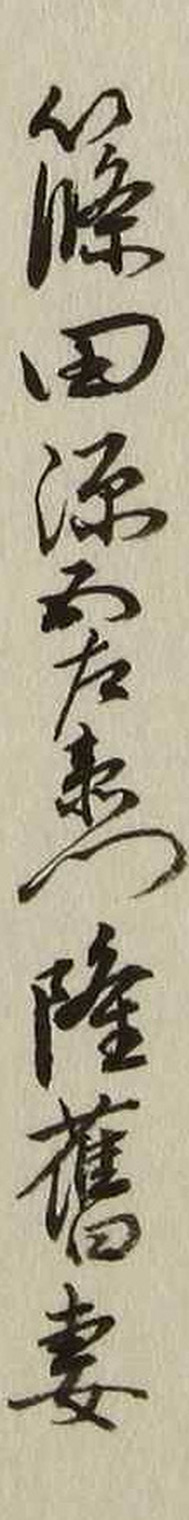篠田源五左衛門隆旧妻
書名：諸士系譜　巻之149　そ之部2
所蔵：会津若松市立会津図書館
